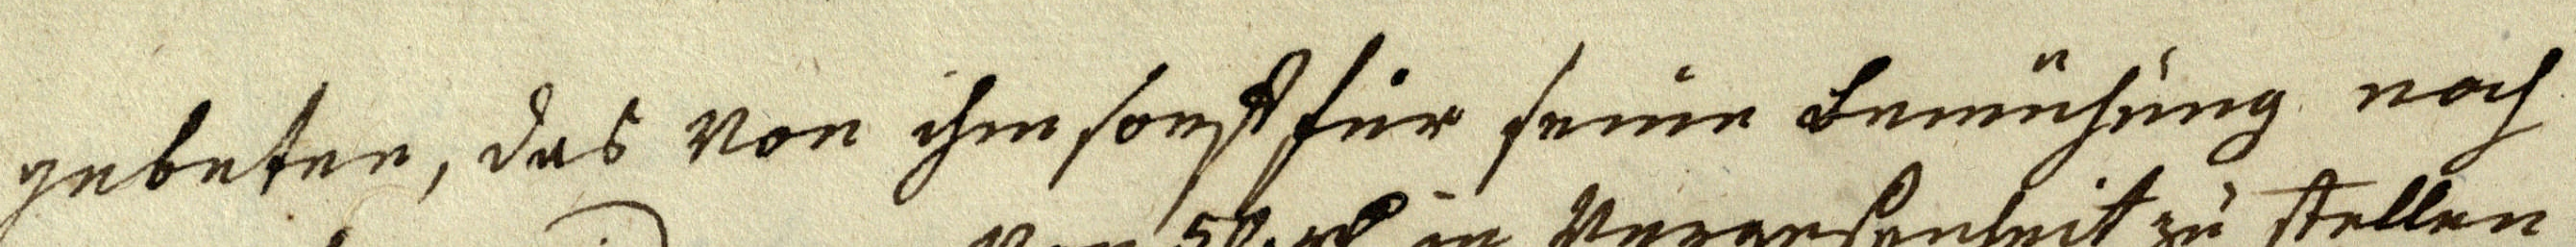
gebeten, das von ihm sonst für seine Bemühung noch
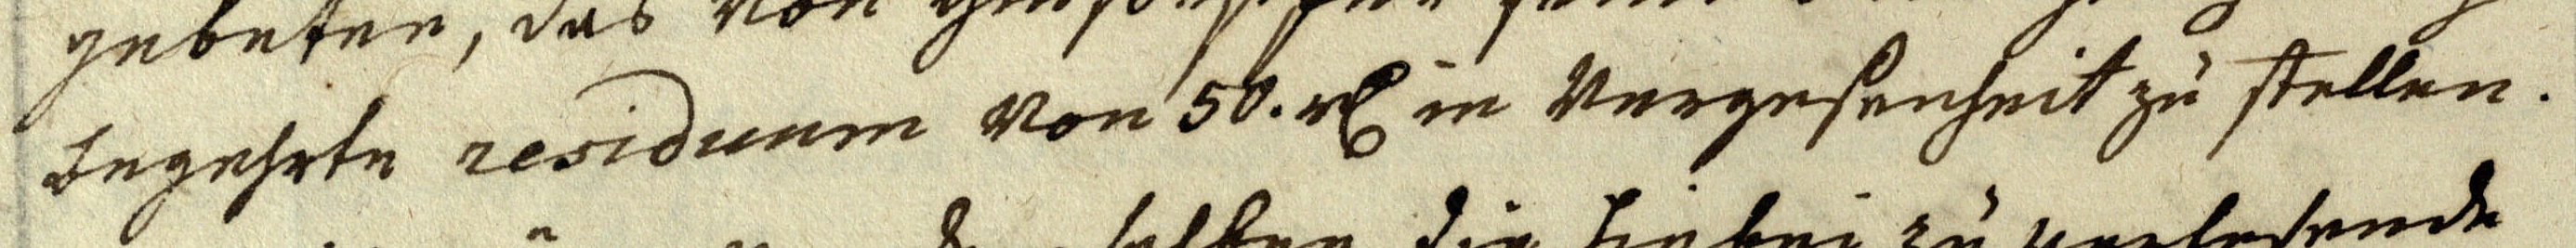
begehrte residuum von 50 rl. in Vergeßenheit zu stellen.
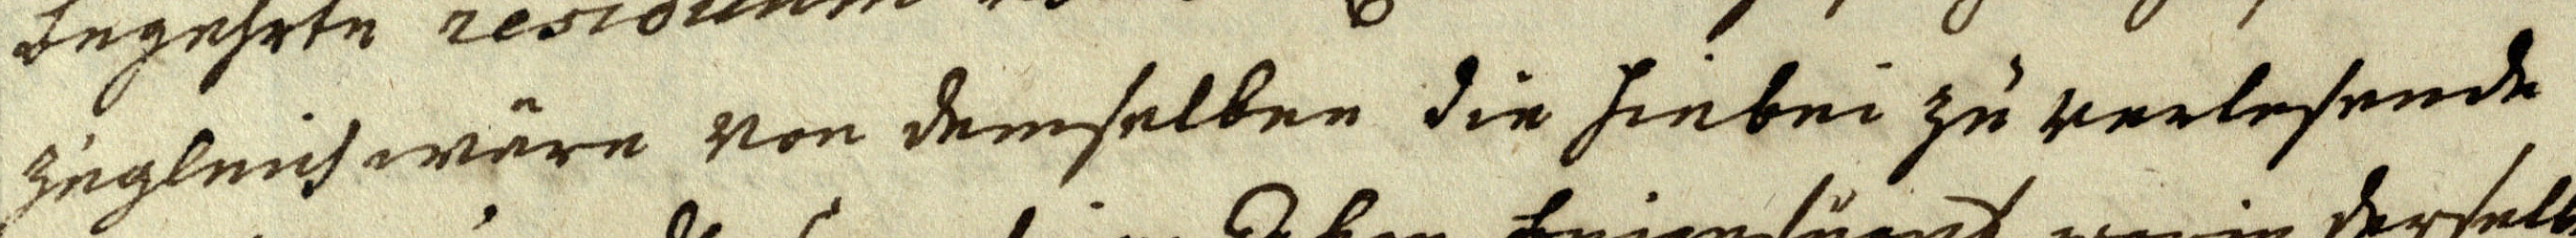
Zugleich wäre von demselben die hiebei zu verlesende
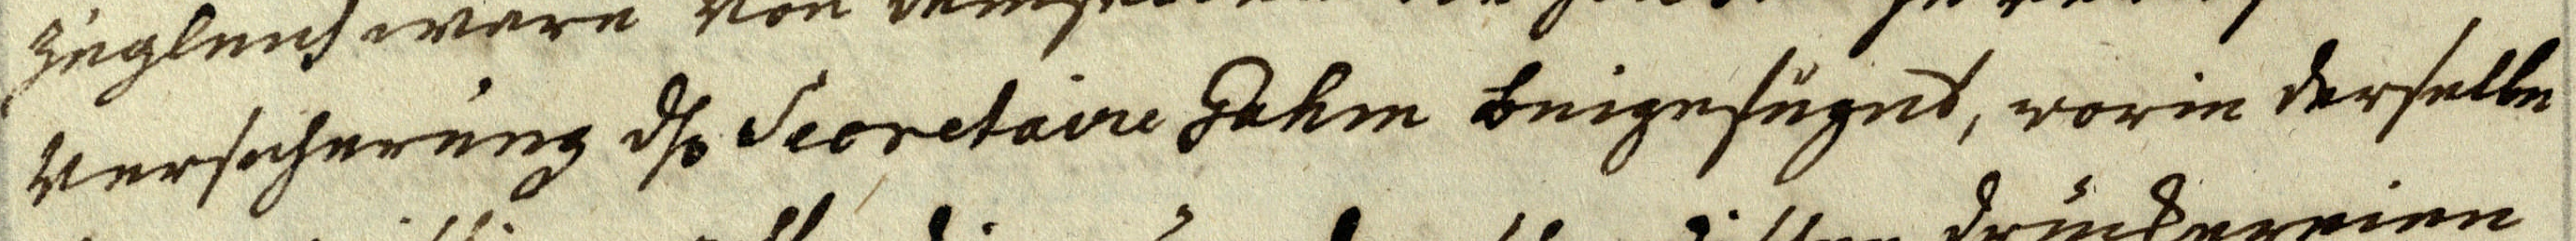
Versicherung dh. Secretaire Gahm beigefüget, worin derselbe
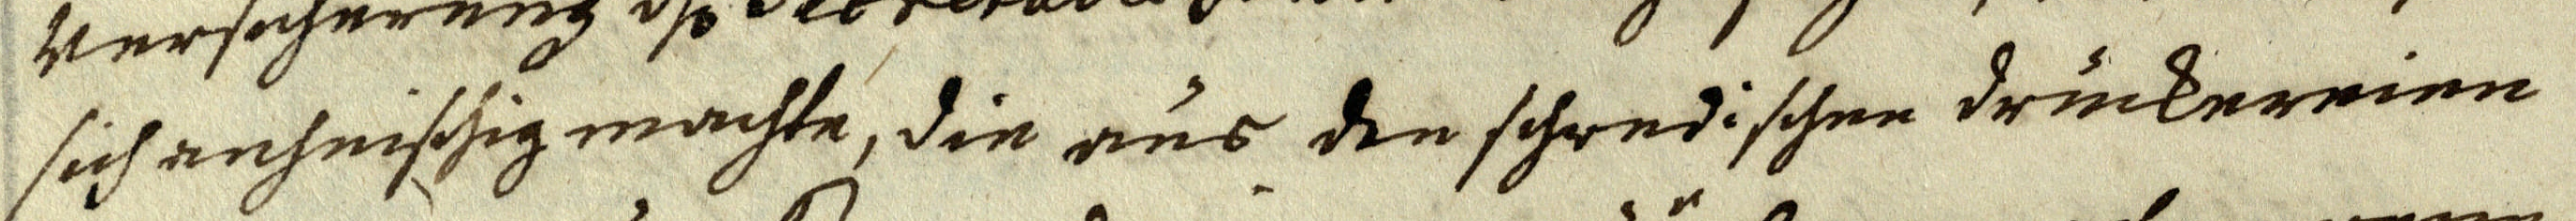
sich anheischig machte, die aus den schwedischen Druckereien
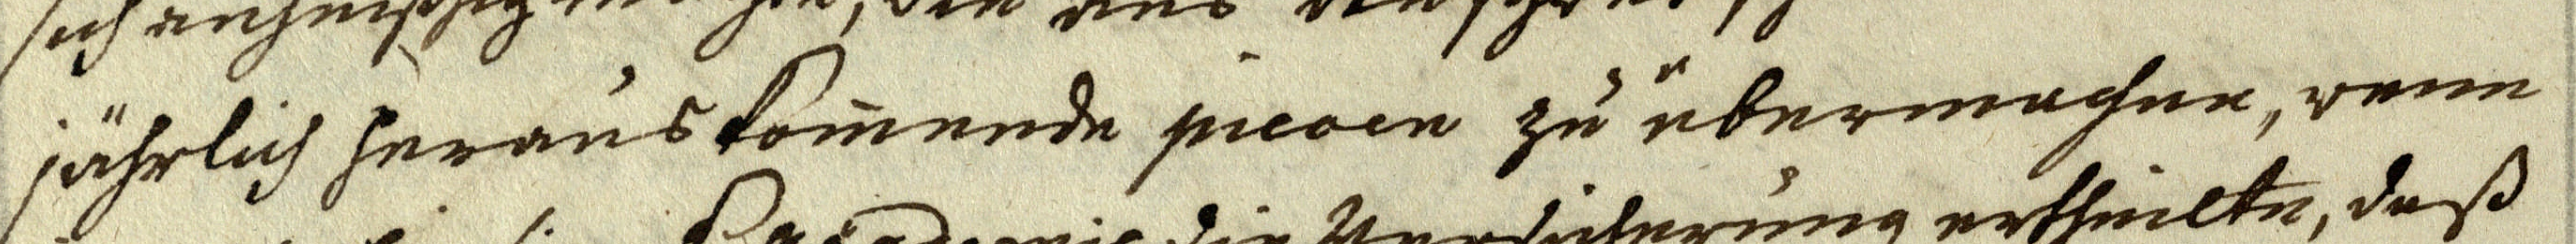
jährlich herauskommende piecen zu übermachen, wenn
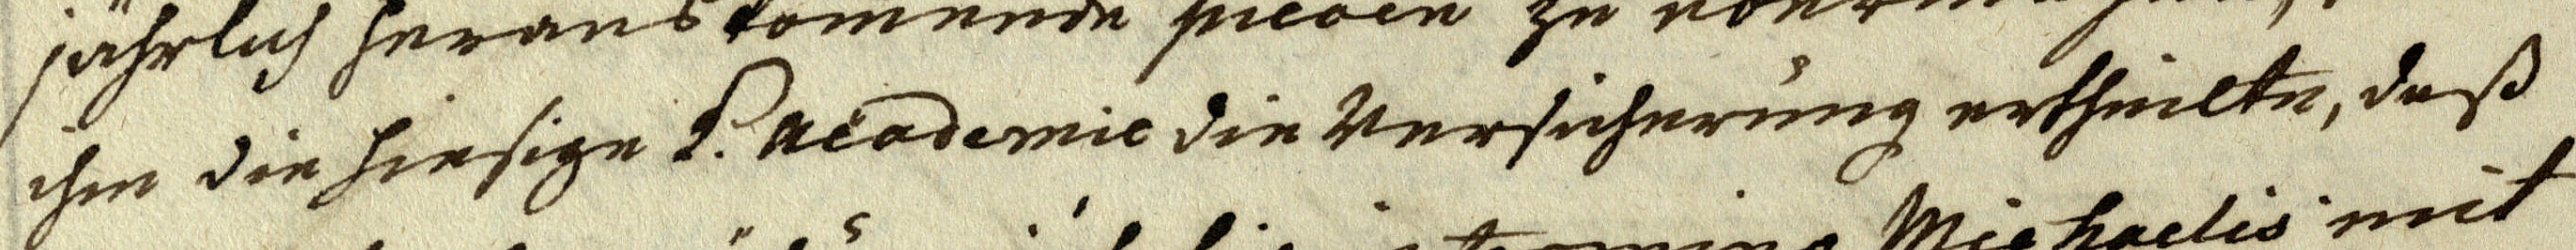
ihm die hiesige K. Academie die Versicherung ertheilte, daß
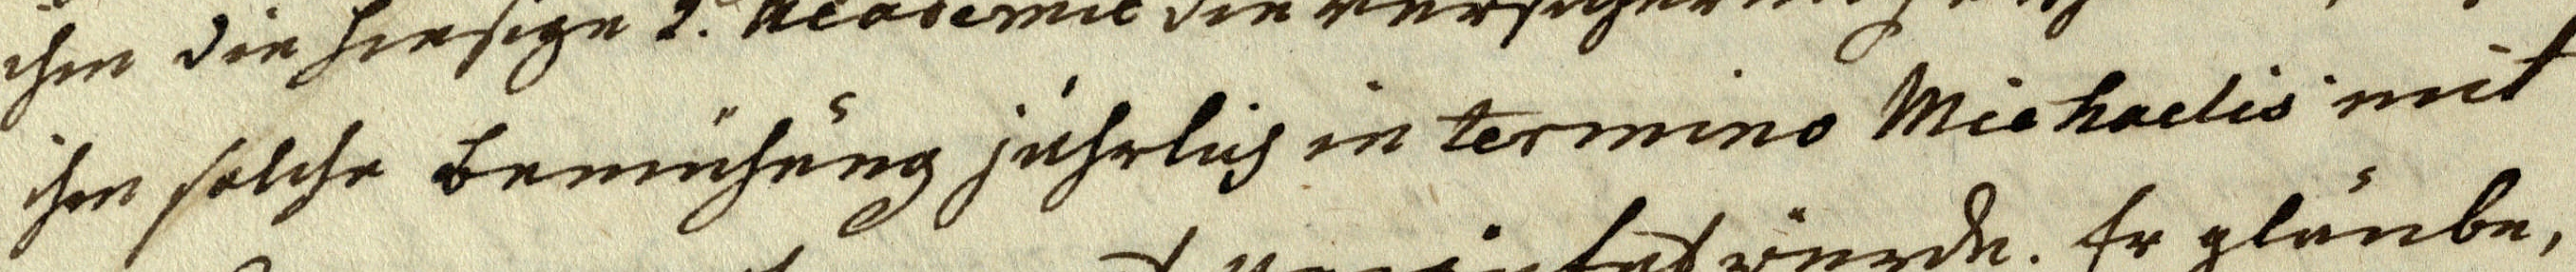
ihm solche Bemühung jährlich in termino Michaelis mit
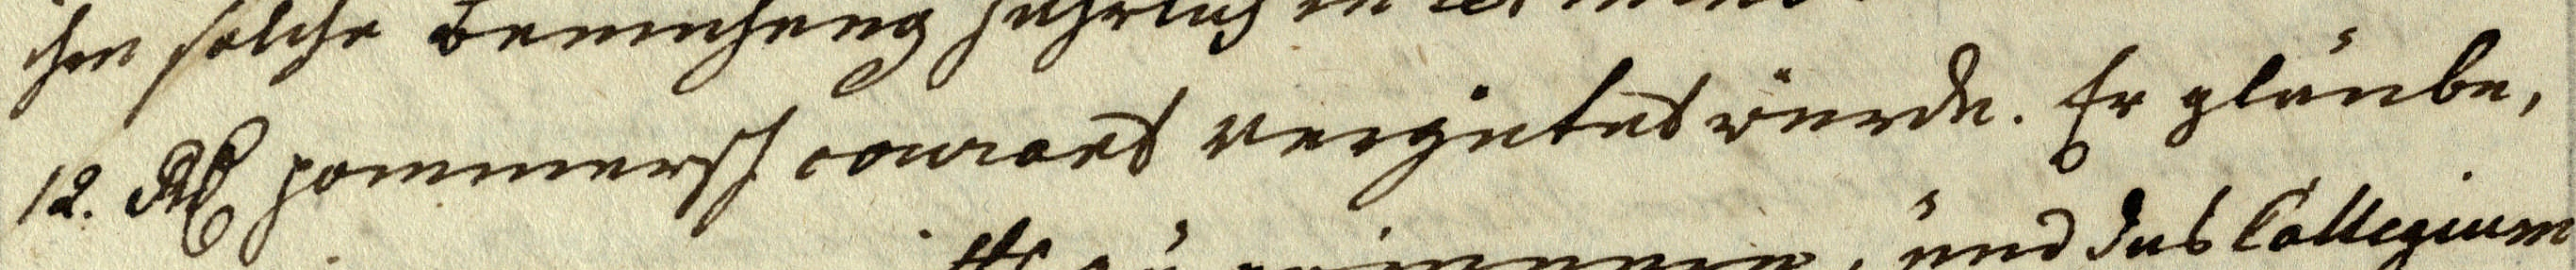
12. Rl. pommersch courant vergütet würde. Er glaube,
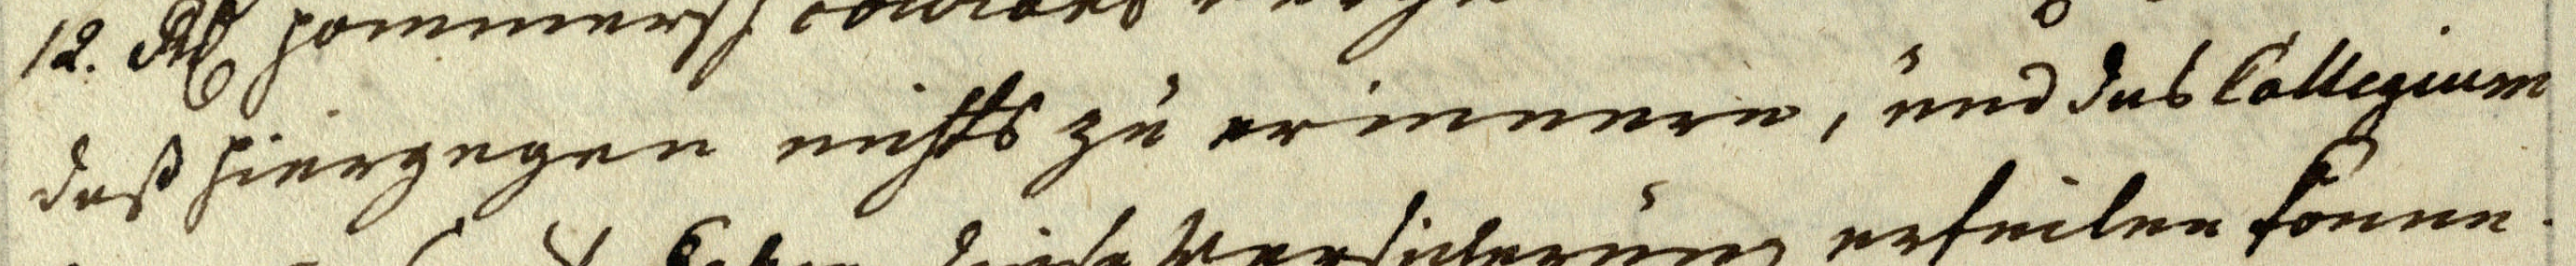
daß hiergegen nichts zu erinnern, und das Collegium
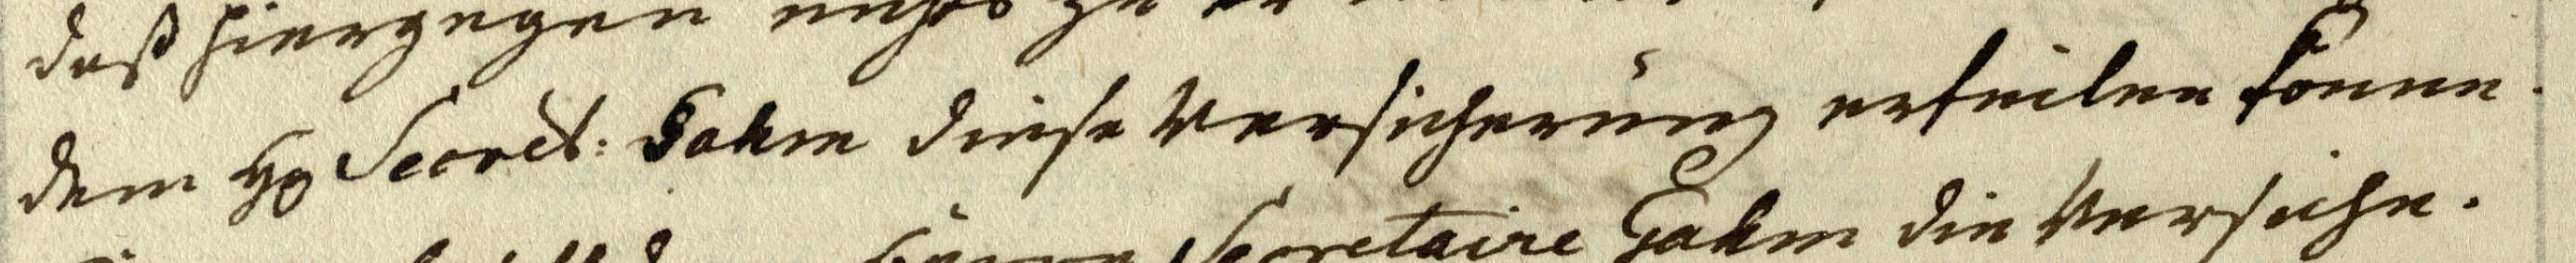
dem H. Secret. Gahm diese Versicherung erteilen könne.
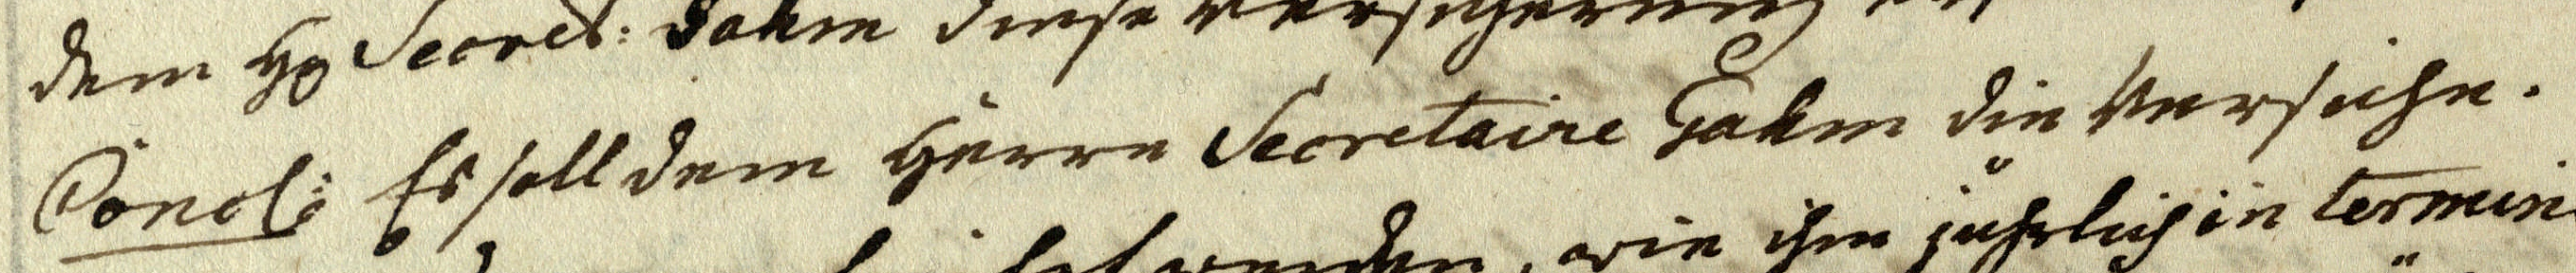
Concl. Es soll dem Herrn Secretaire Gahm die Versiche¬
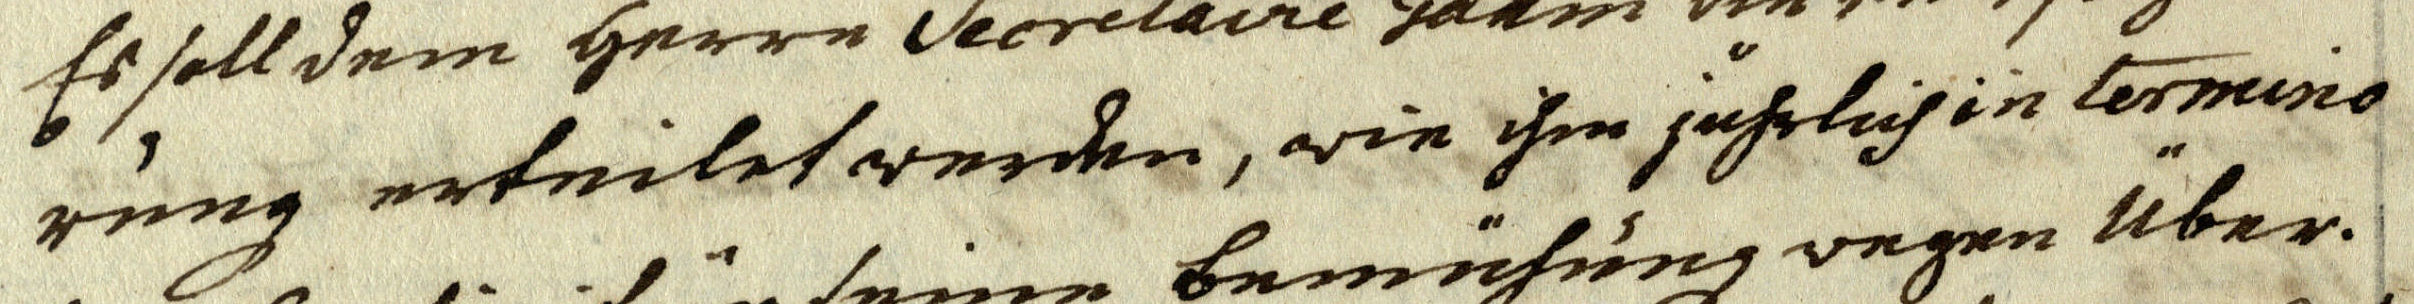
rung erteilet werden, wie ihm jährlich in termino
